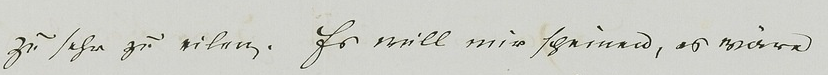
zu sehr zu eilen. Es will mir scheinen, es wäre
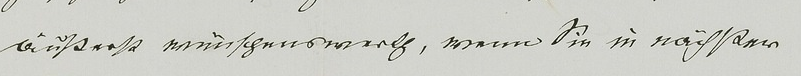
äußerst wünschenswerth, wenn Sie in nächster
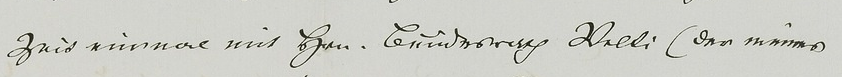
Zeit einmal mit Hrn. Bundesrath Welti (der meines
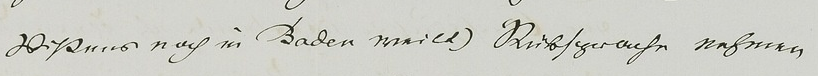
Wißens noch in Baden weilt) Rüksprache nehmen
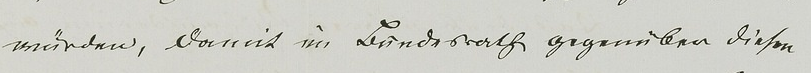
würden, damit im Bundesrath gegenüber diesen
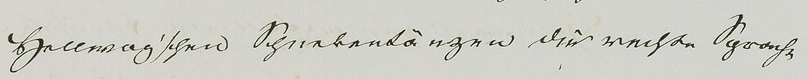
Hellwag'schen Schnekentänzen die rechte Sprache
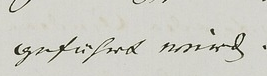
geführt wird. –
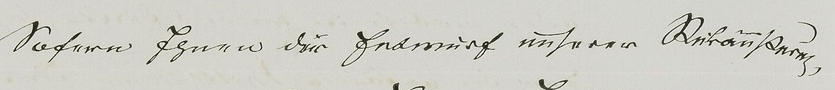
Sofern Ihnen der Entwurf unserer Rükäußerung,
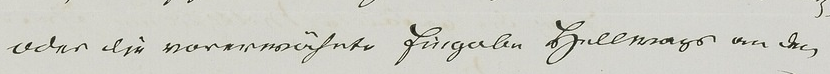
oder die vorerwähnte Eingabe Hellwags an den
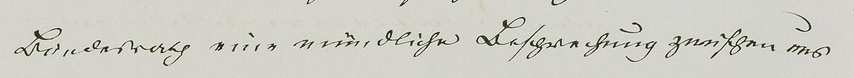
Bundesrath eine mündliche Besprechung zwischen uns
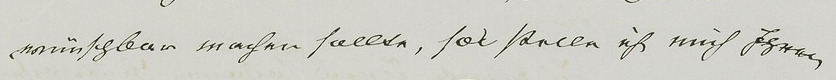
wünschbar machen sollte, so stelle ich mich Ihnen
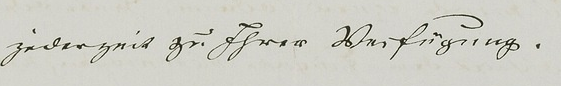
jederzeit zu Ihrer Verfügung.
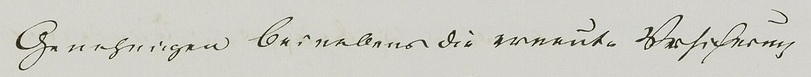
Genehmigen beinebens die erneute Versicherung
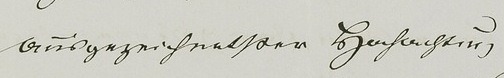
ausgezeichneter Hochachtung
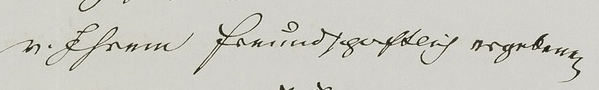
v. Ihrem freundschaftlich ergebenen
